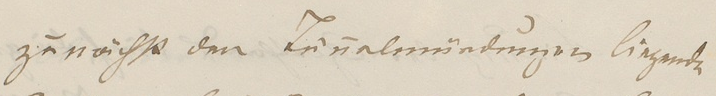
zunächst den Tunnelmündungen liegende
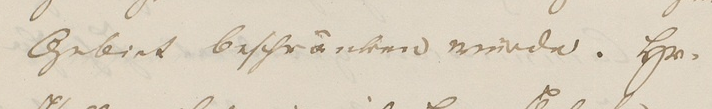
Gebiet beschränken würde. Hr.
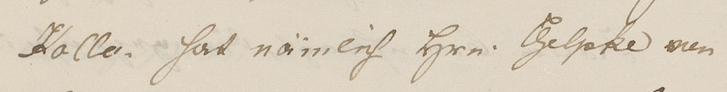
Koller hat nämlich Hrn. Gelpke von
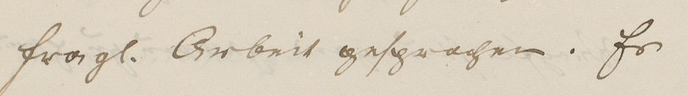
fragl. Arbeit gesprochen. Es
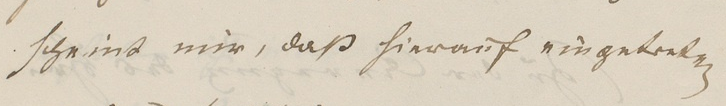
scheint mir, daß hierauf eingetreten
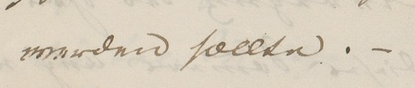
werden sollte. –
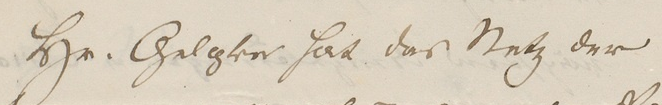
Hr. Gelpke hat das Netz der
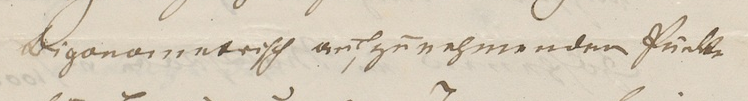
trigonomisch aufzunehmenden Punkte
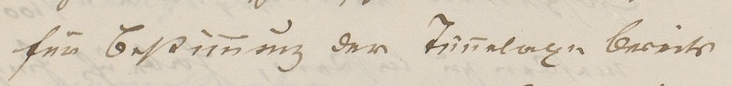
für Bestimmung der Tunnelage bereits
